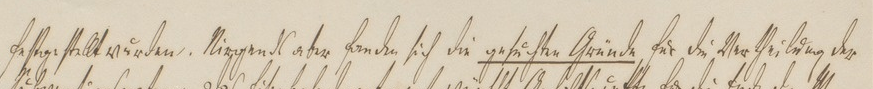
festgestellt wurden. Nirgends aber fanden sich die gesuchten Gründe für die Vertheilung der
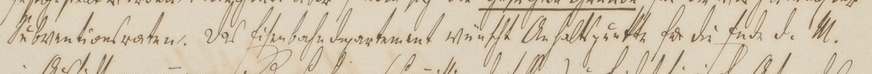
Subventionsraten. Das Eisenbahndepartement wünscht Anhaltspunkte für die Ende d. M.
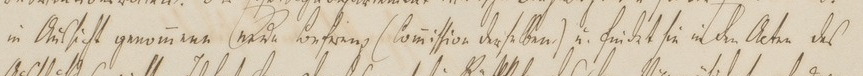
in Aussicht genommene neue Conferenz (Commission derselben) u. findet sie in
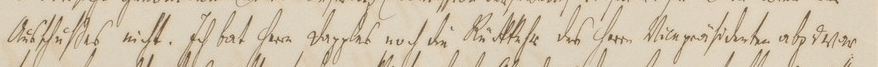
nicht. Ich bat Herrn Dapples noch die Rückkehr des Herrn Vicepräsidenten
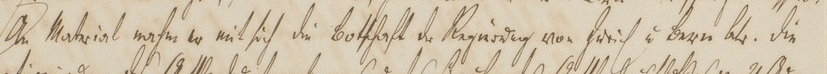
An Material nahm er mit sich die Botschaft dr Regierung von Zürich u Bern btr. die
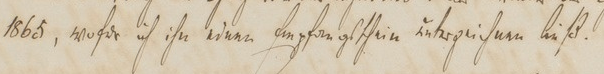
1865, wofür ich ihn einen Empfangsschein unterzeichnen ließ.
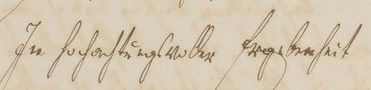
hochachtungsvoller Ergebenheit
